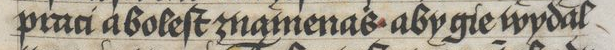praci a boleſt znamenaṡ.aby gie wydal
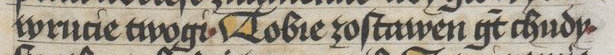wrucie twogi.Tobie zoſtawen ḡt chudy.
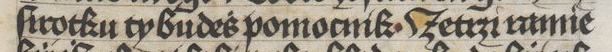ſirotku ty budeš pomocnik.Zetrzi ramie
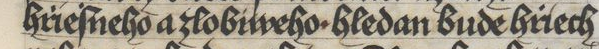hṙieẛneho a zlobiweho.hledan bude hṙiech
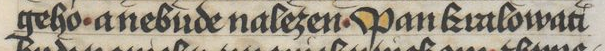geho.a nebude nalezen.Pan kralowati
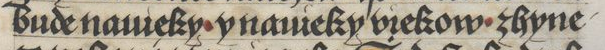bude navieky.y navieky viekow.zhyne¬
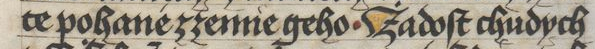te pohane zzemie geho.Zadoſt chudych
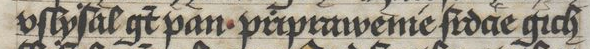uſlyẛal ḡt pan.pṙipraweníe ſrdcie gich
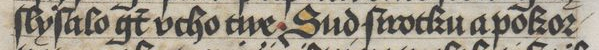ſlyẛalo ḡt ucho twe.Sud ſirotku a pokor¬
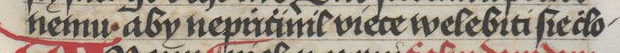nemu.aby nepṙiċinil viece welebiti ſie ċlo¬
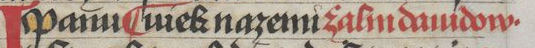Panu viek nazemi żalm davidow.
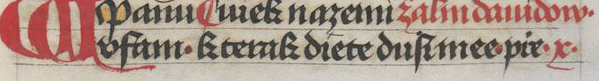ufam.kterak diete duẛi mee.pṙe.x.
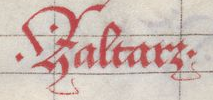.Żaltarz.
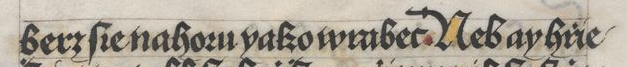berz ſie nahrou yako wrabec.Neb ay hṙie¬
